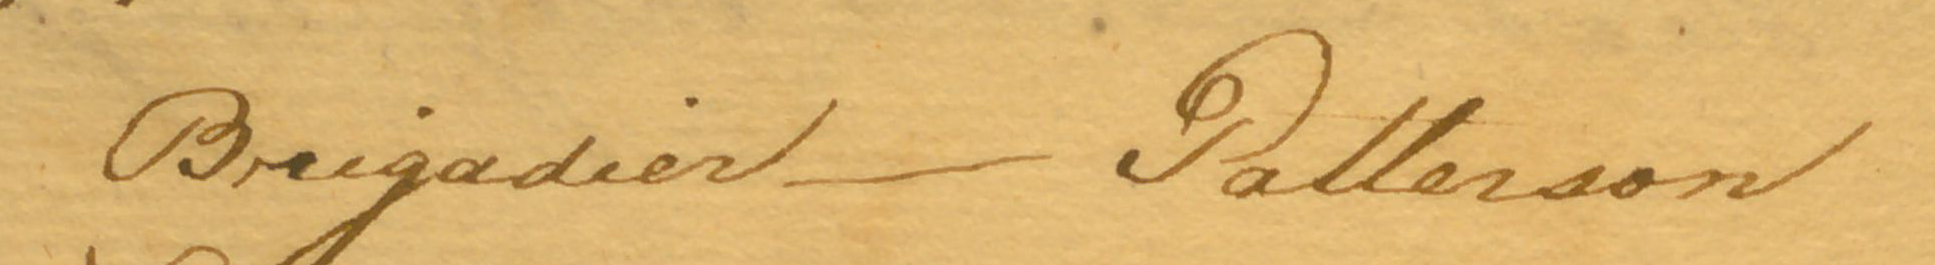Brigadier- Patterson
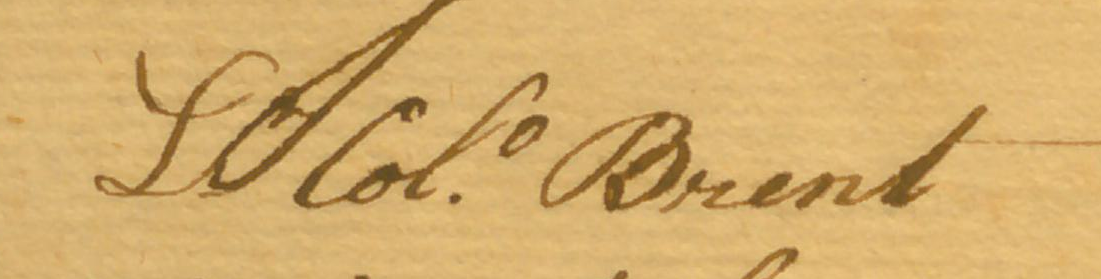L^t. Col^o. Brent
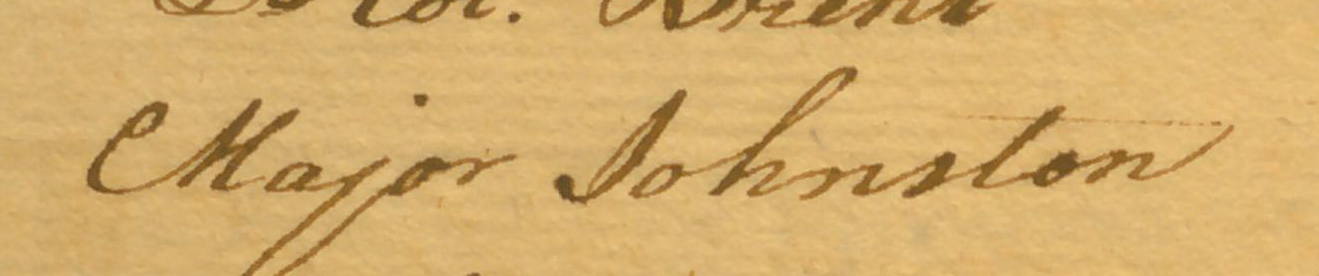Major Johnston
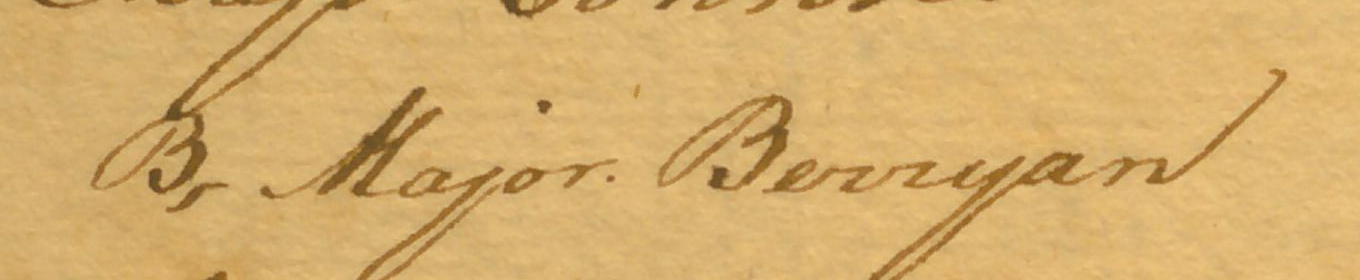B. Major Berryan
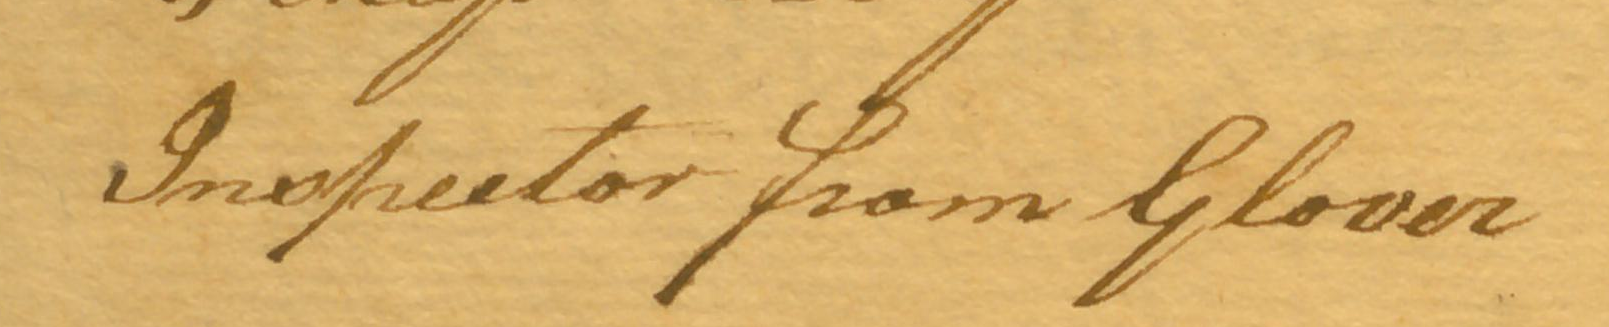Inspector from Glover
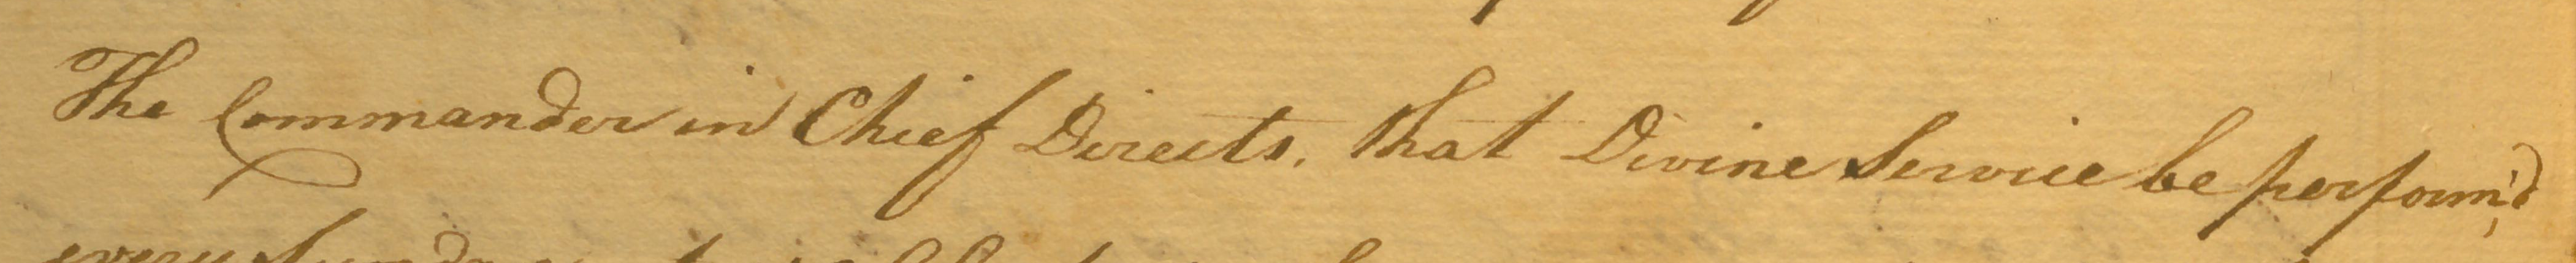The Commander in Chief Directs that Divine Service be perform'd
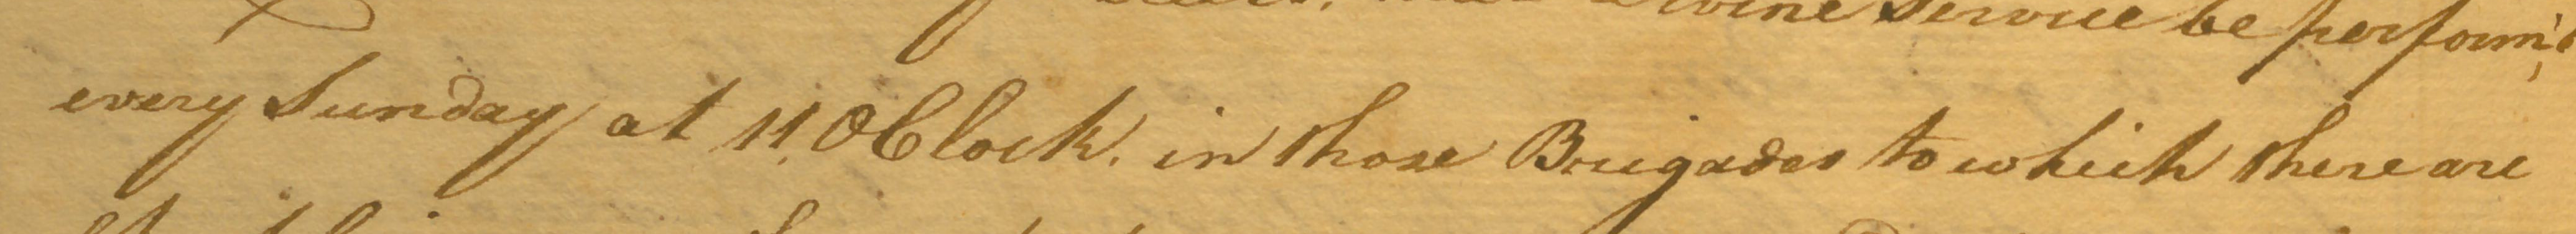every Sunday at 11. OClock in those Brigades to which there are
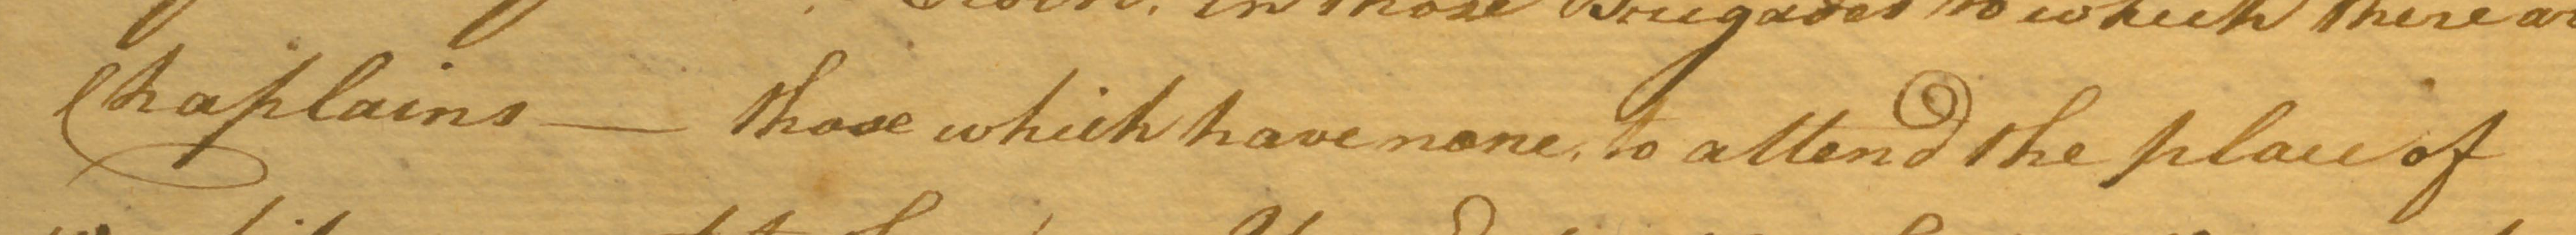Chaplains- those which have none to attend the place of
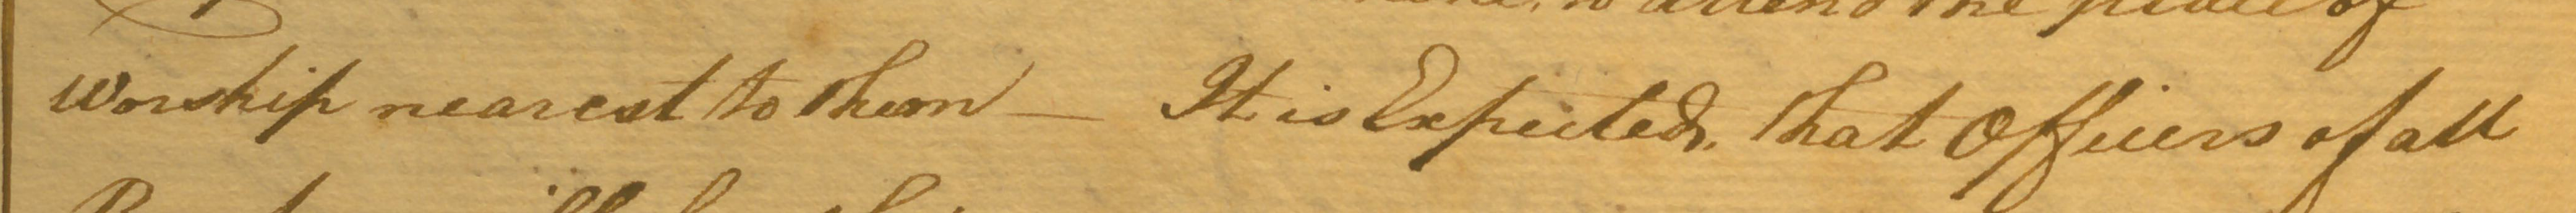worship nearest to them- It is Expected that Officers of all
